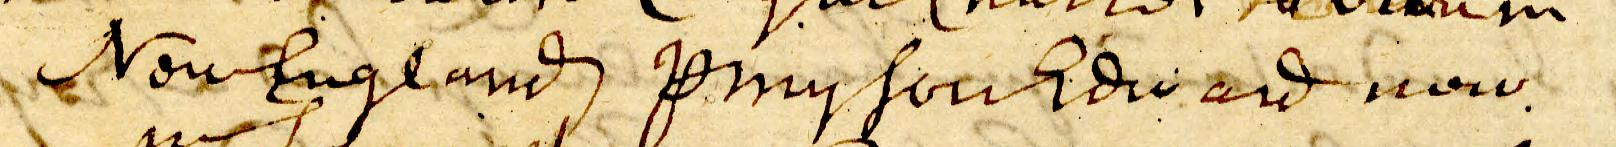New England per my Son Edward now
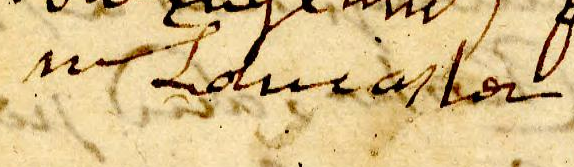in Lancaster
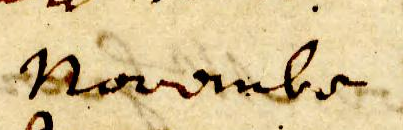November
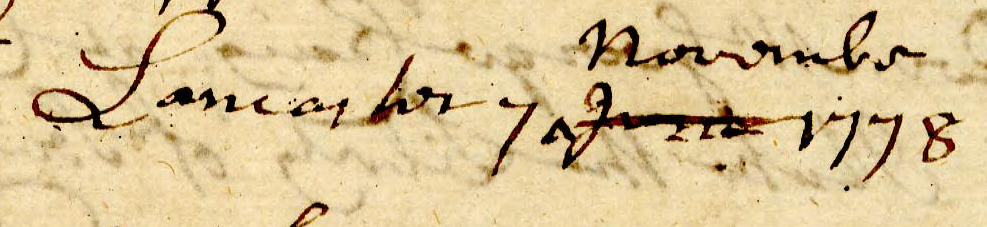Lancaster 7 [June] 1778
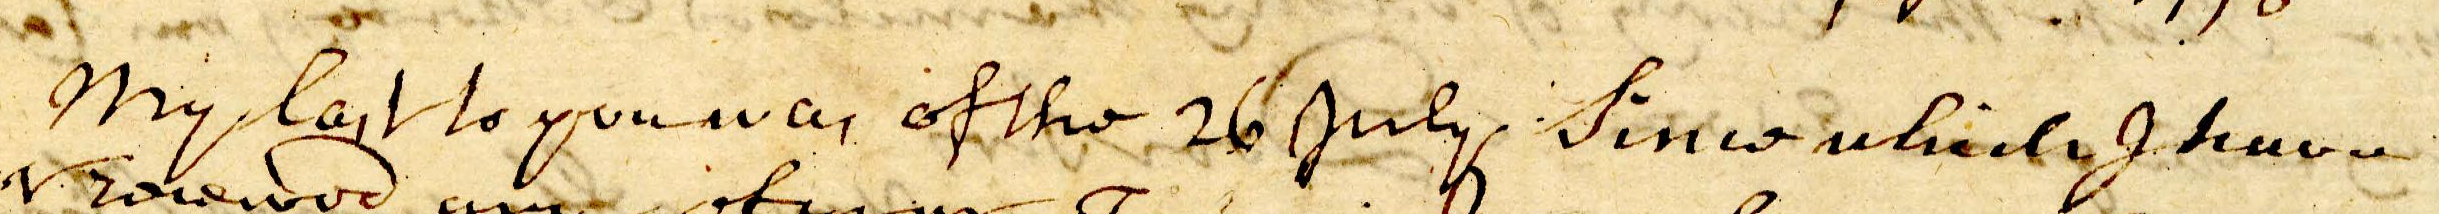My last to you was of the 26 July Since which I have
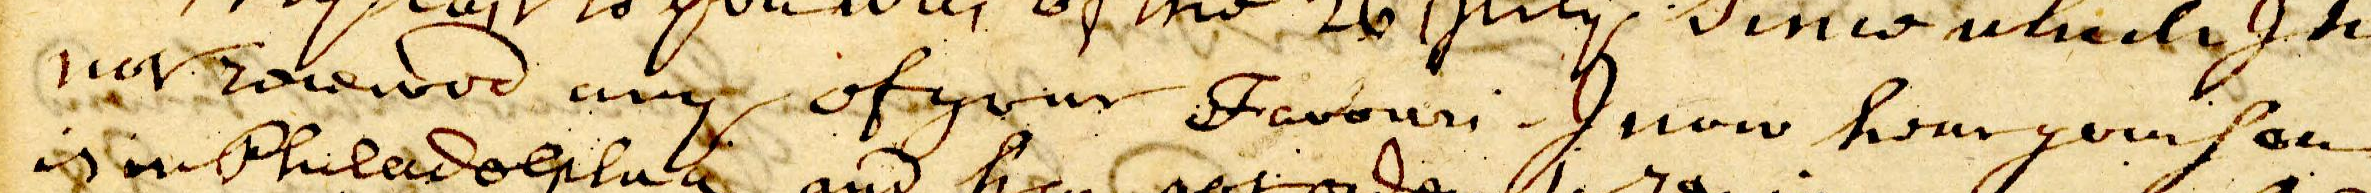not received any of your Favours - I now hear your Son
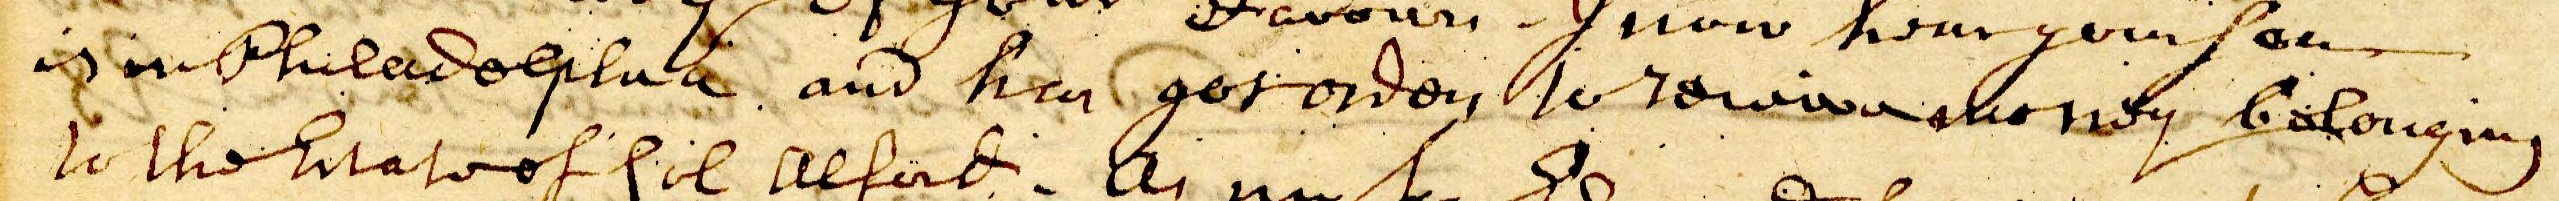in Philadelphia and has got order to receive money belonging
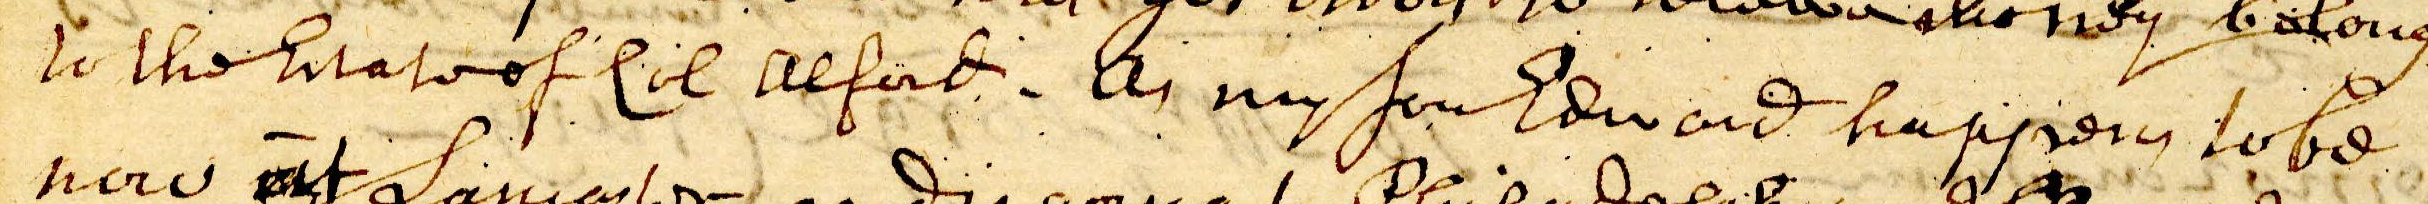to the Estate of Col Alford: As my Son Edward happens to be
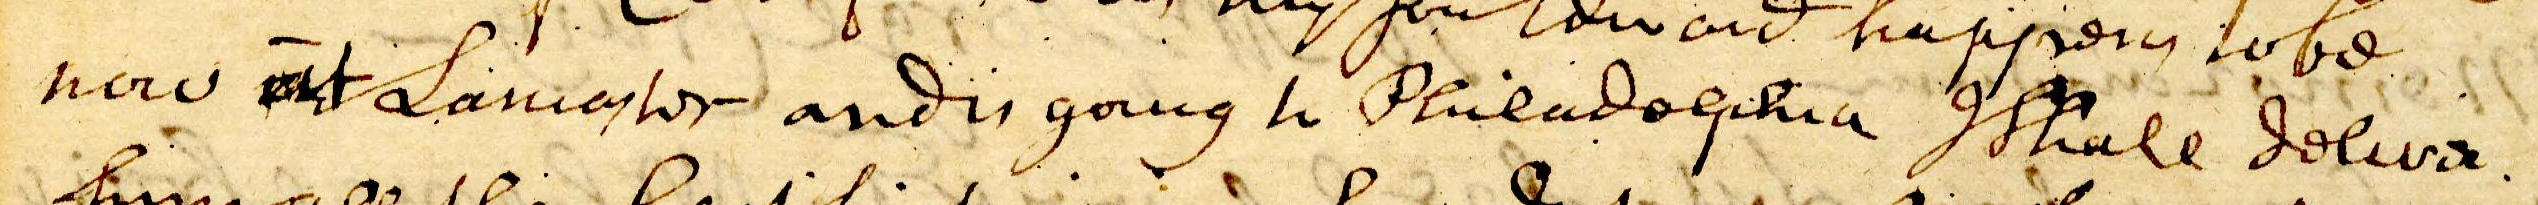here at Lancaster and is going to Philadelphia I Shall deliver
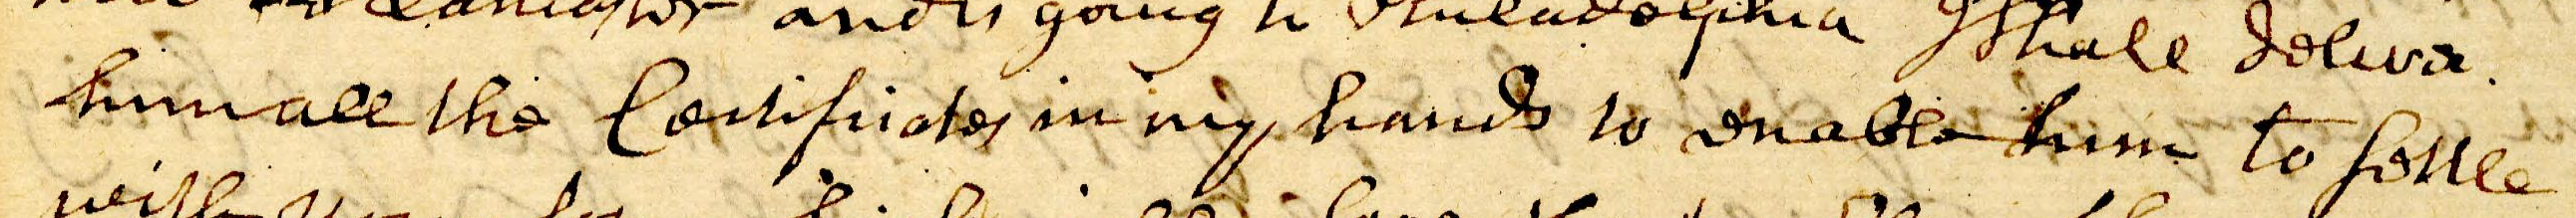him all the Certificates in my hands to enable him to settle
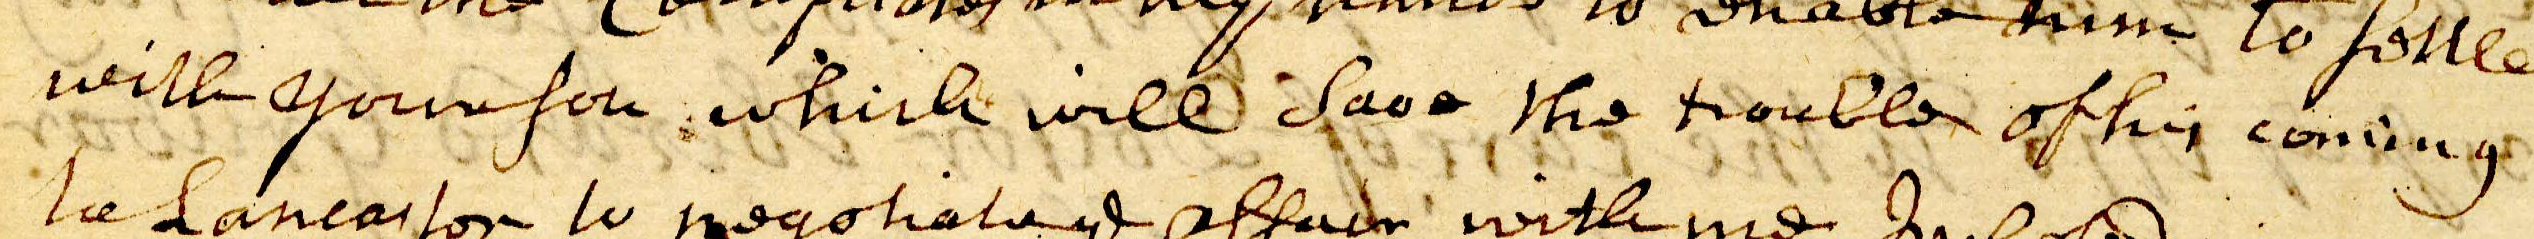with Your Son which will save the trouble of his coming
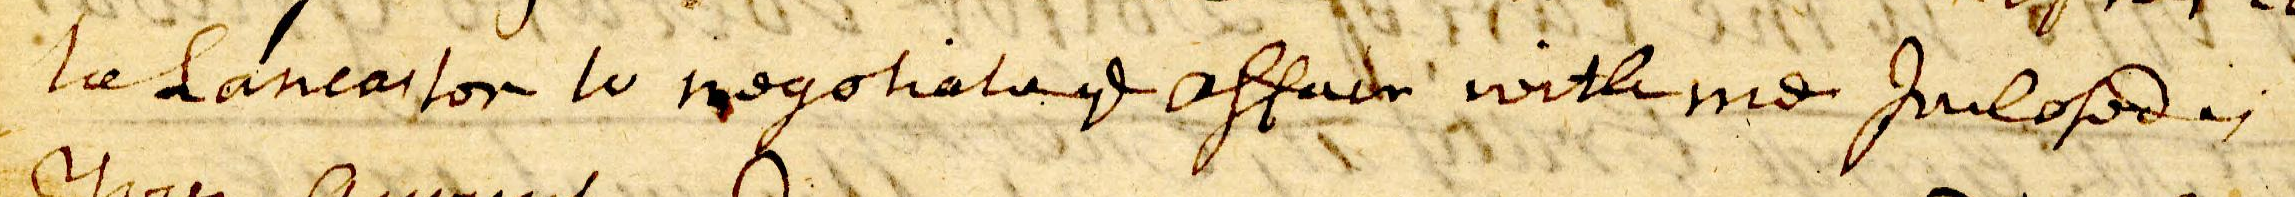to Lancaster to negotiate y^e Affair with me Inclosed is
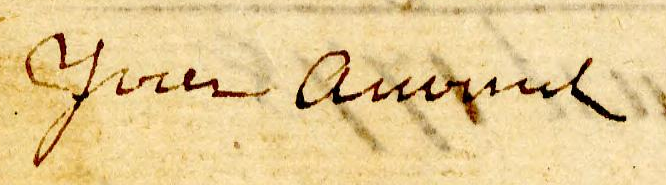Your Account
